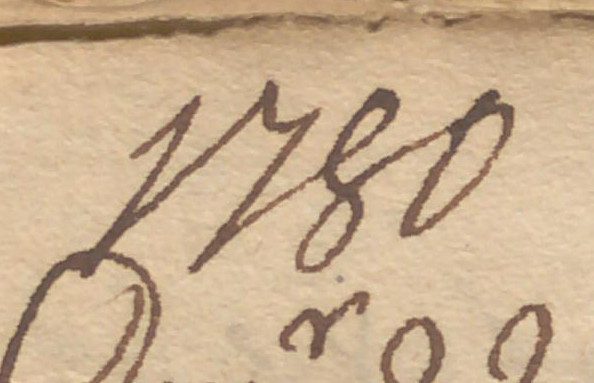1780
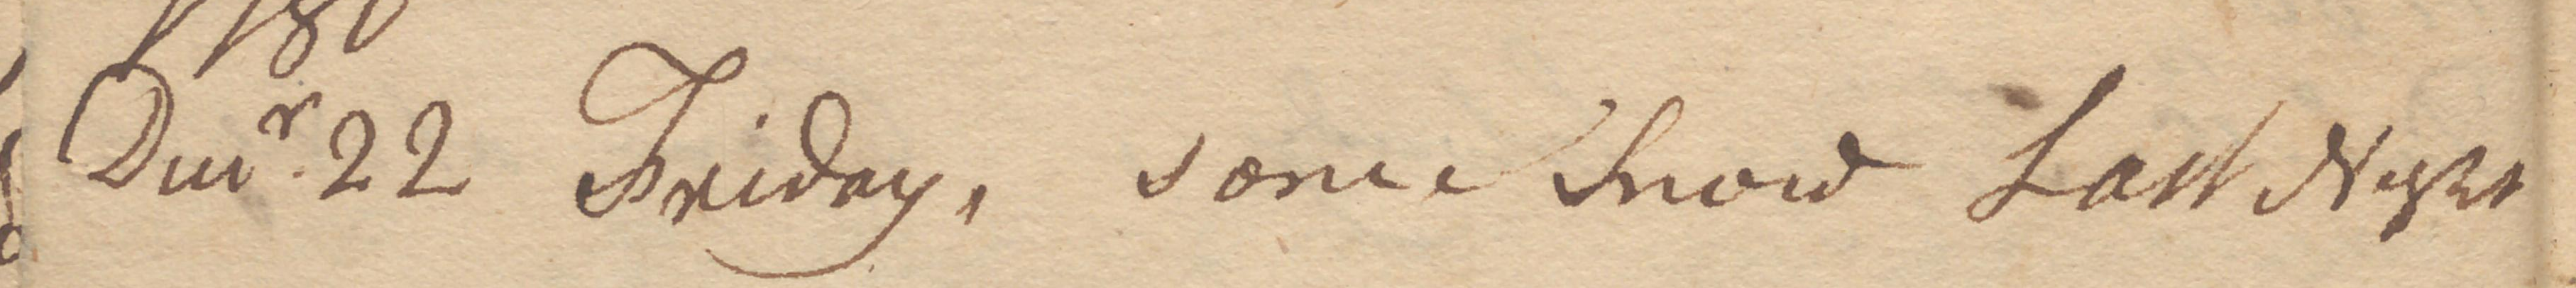Dec^r. 22 Friday, some snow Last Night
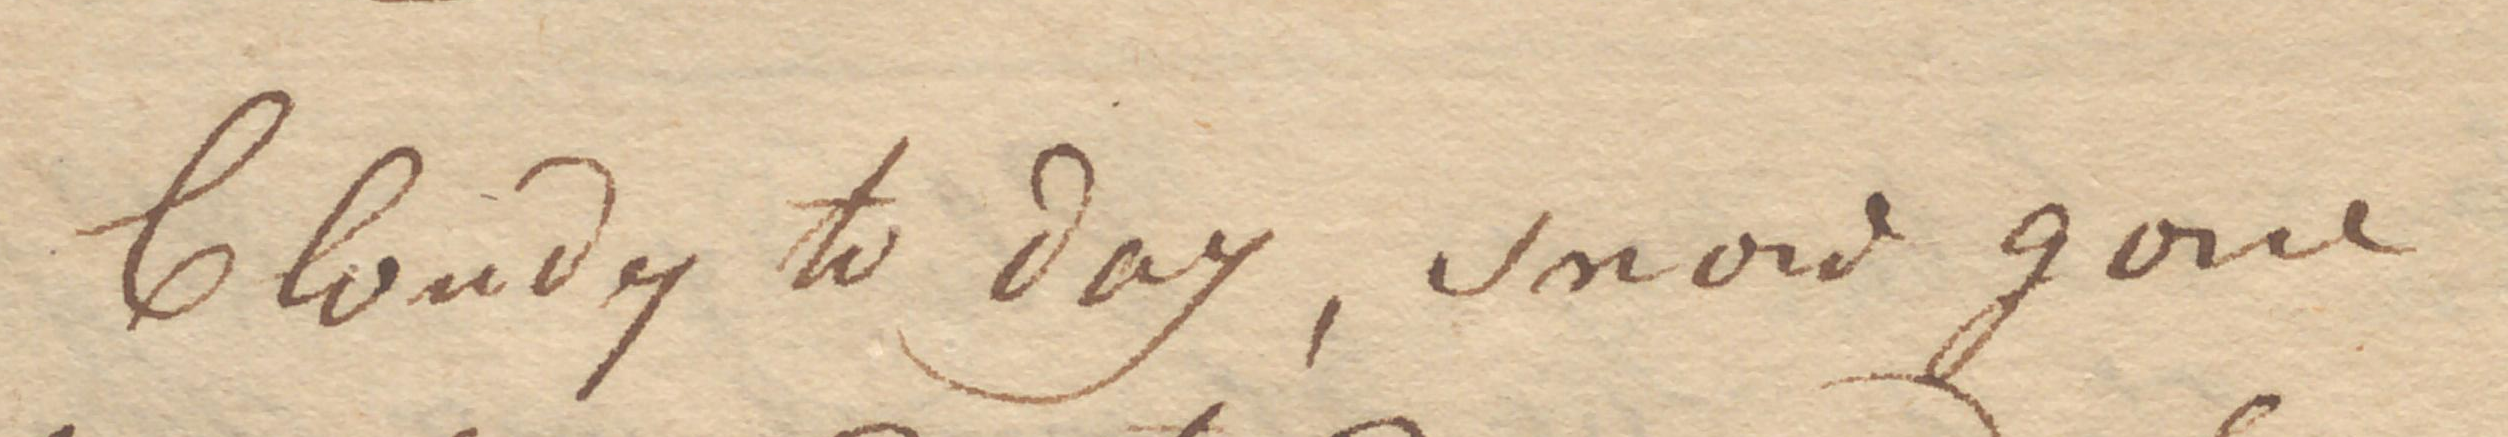Cloudy to day, snow gone
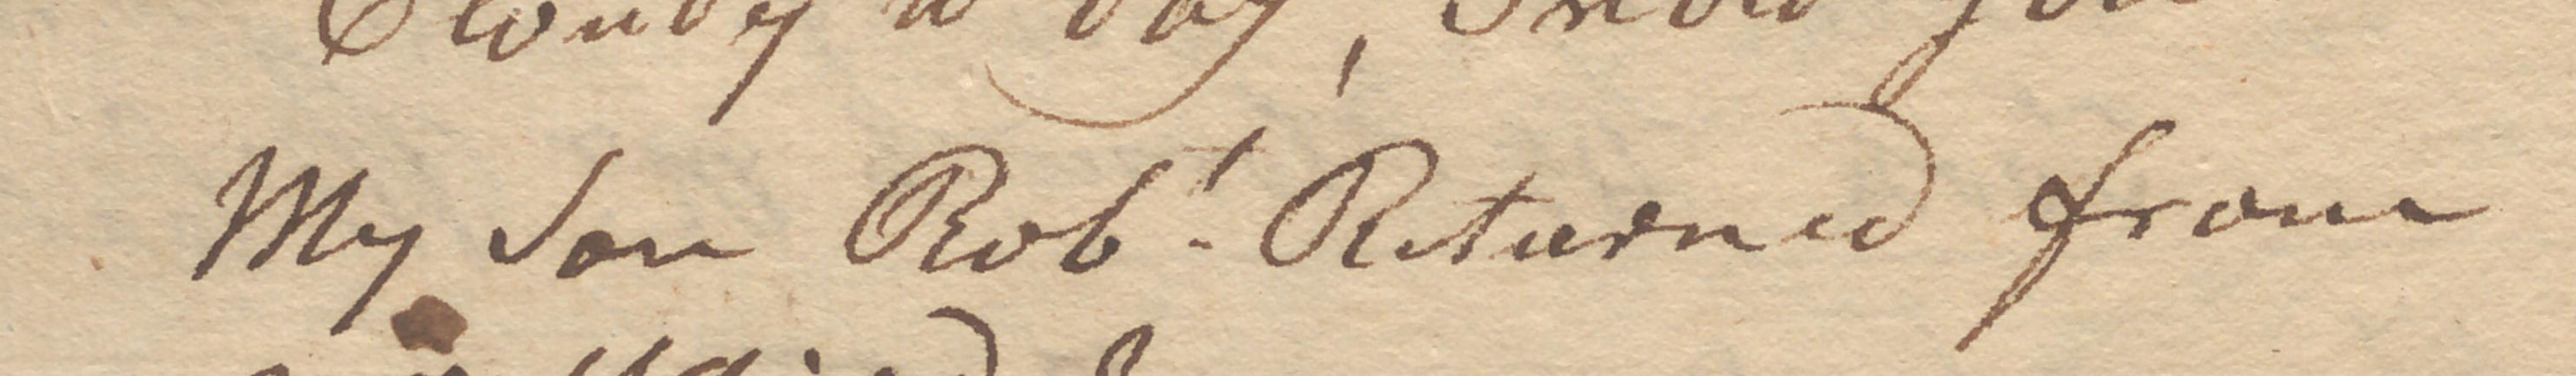My Son Rob^t. Returned from
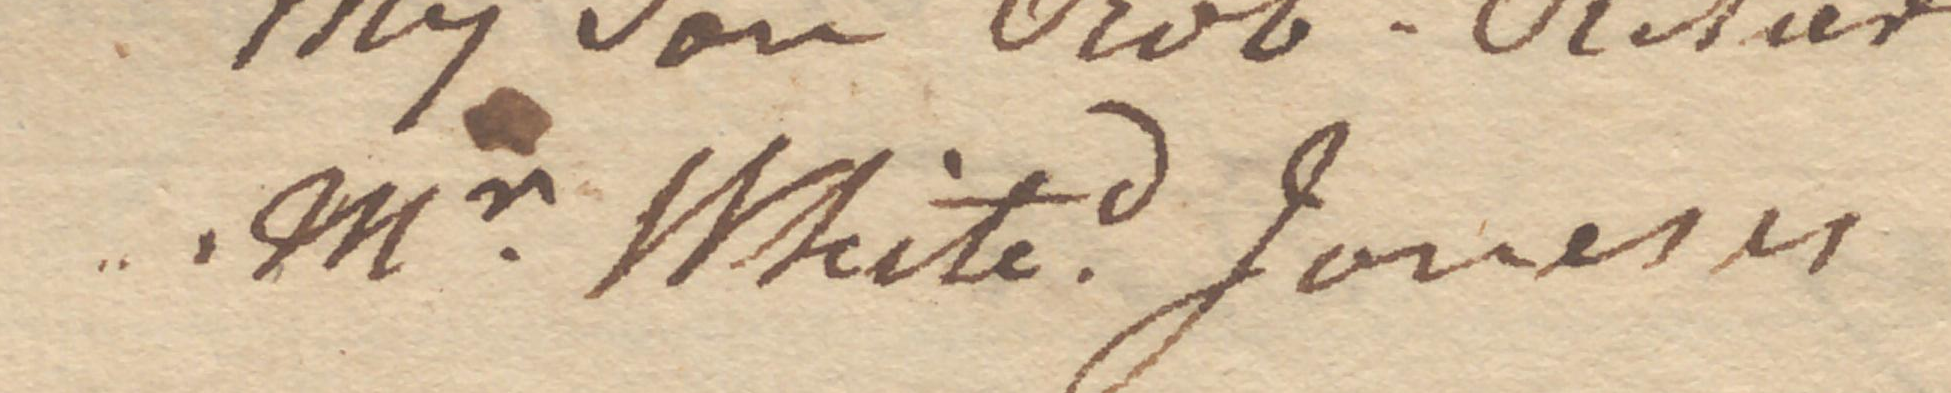M^r. White^d. Joneses
